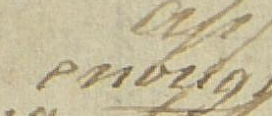enough
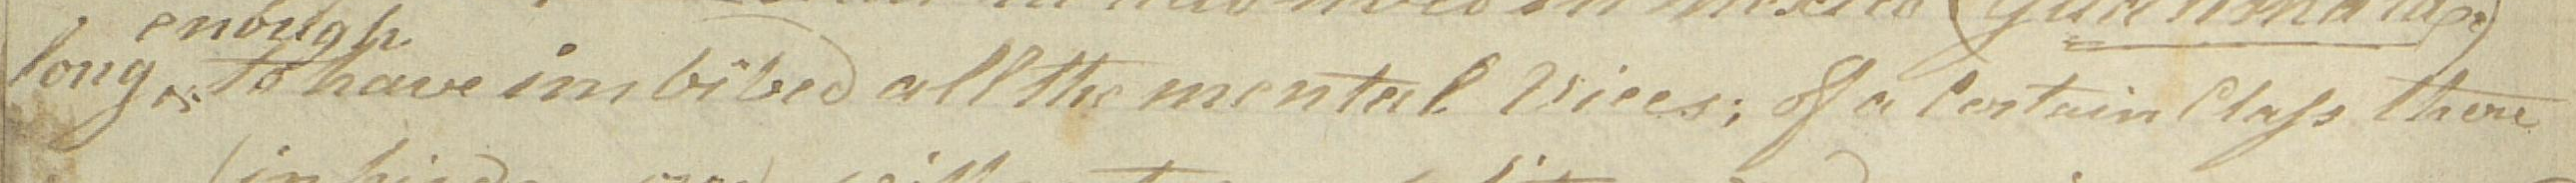long ^ to have imbibed all the mental Vices; of a Certain Class there
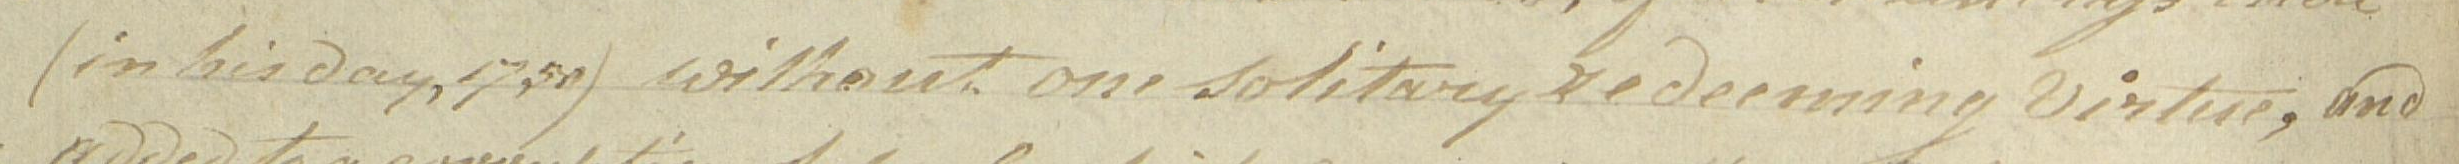(in his day, 1750) without one solitary redeening Virtue, and
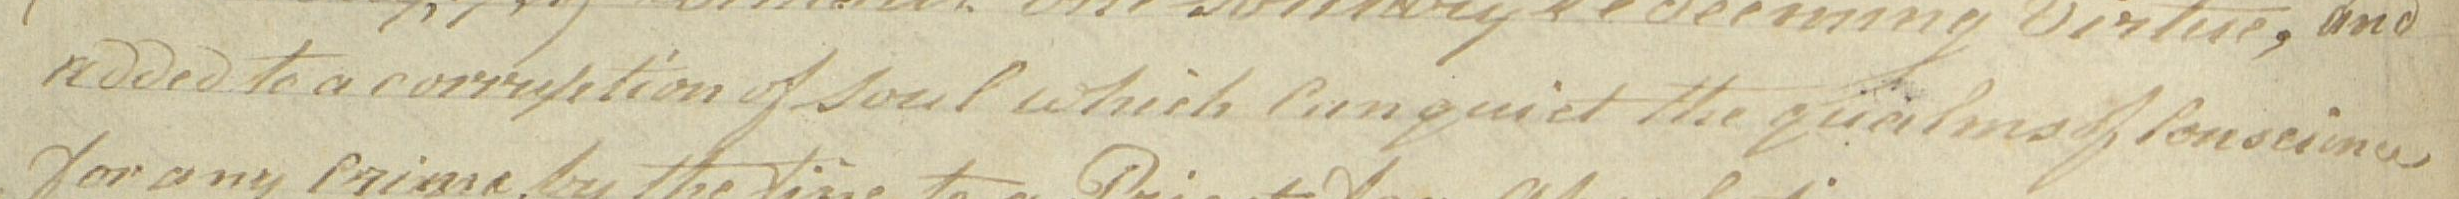Added to a corruption of soul which can quiet the qualms of Conscience
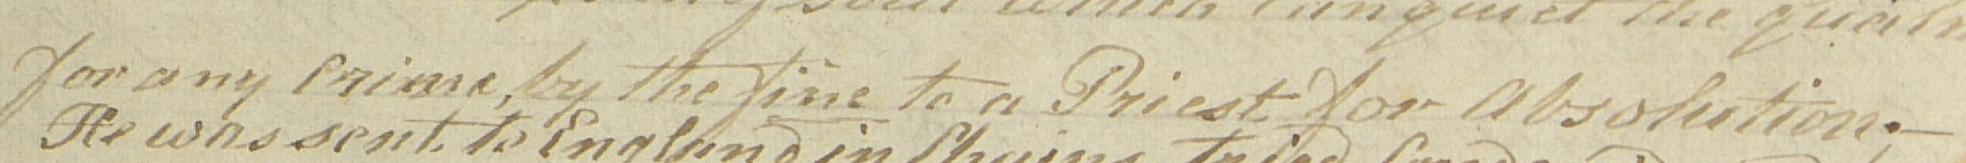for any crime, by the fine to a Priest for Absolution.
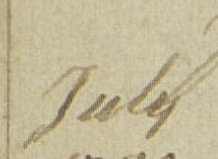July
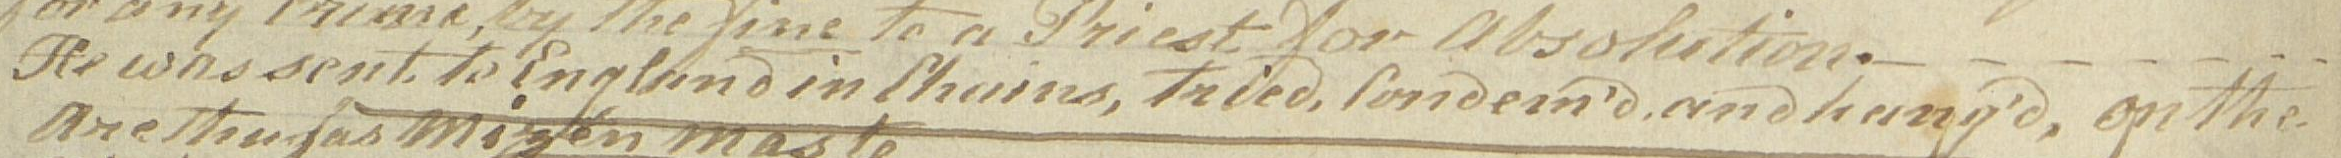He was sent to England in Chains, tried Condem'd and hang'd, on the
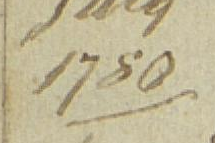1780
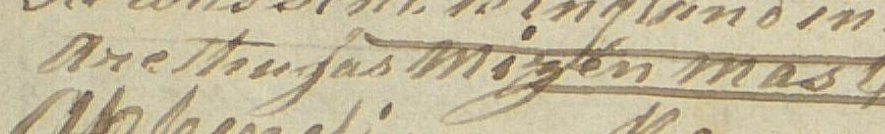Are thufas Mizen mast
